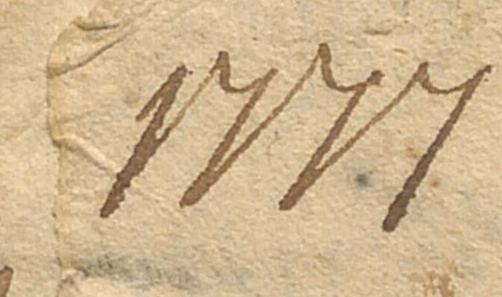1777
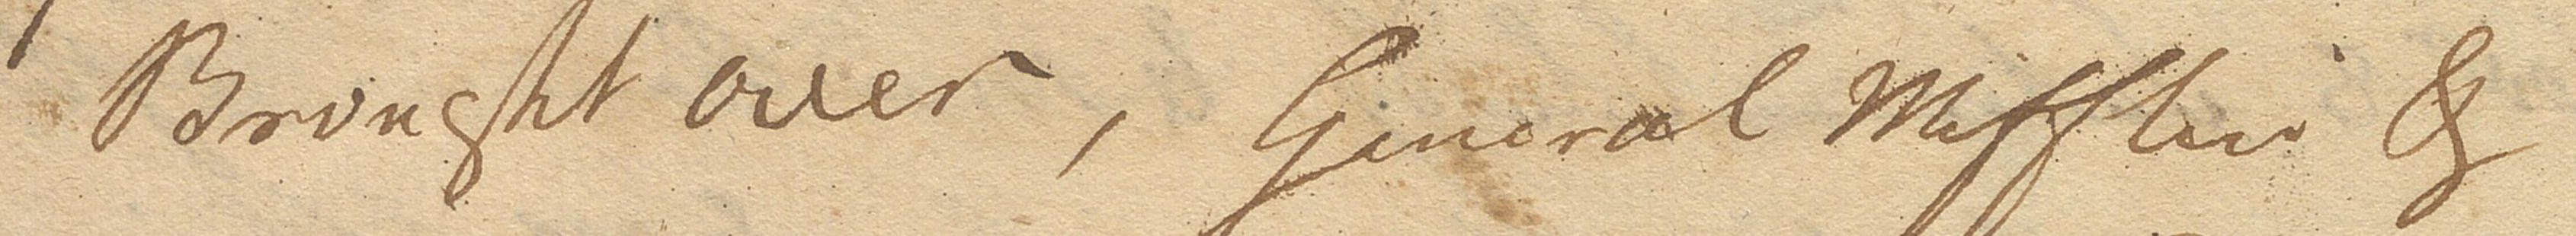Brought over, General Mifflin &
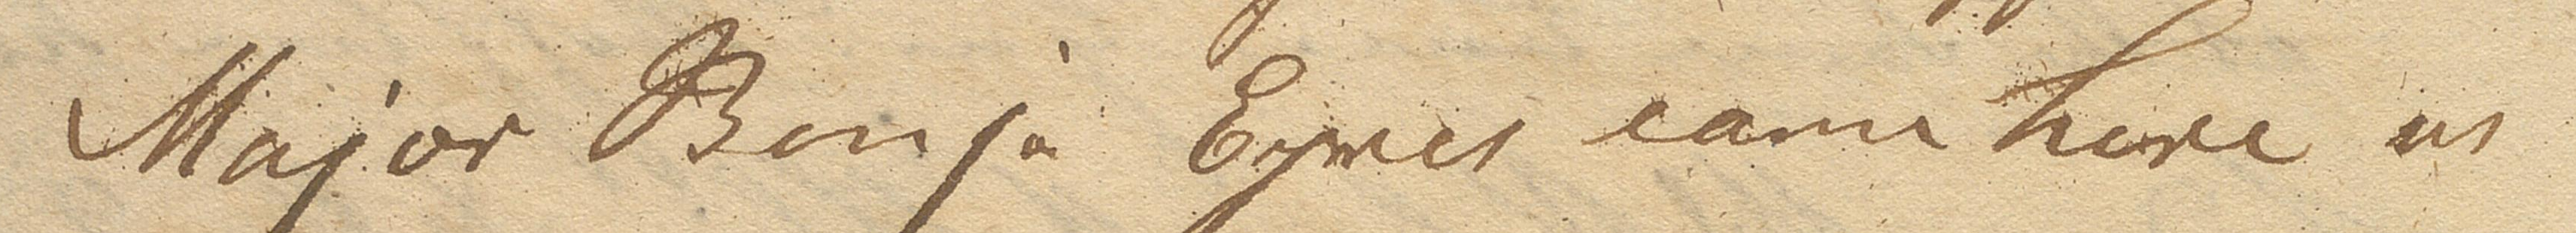Major Benha. Eyres came here us
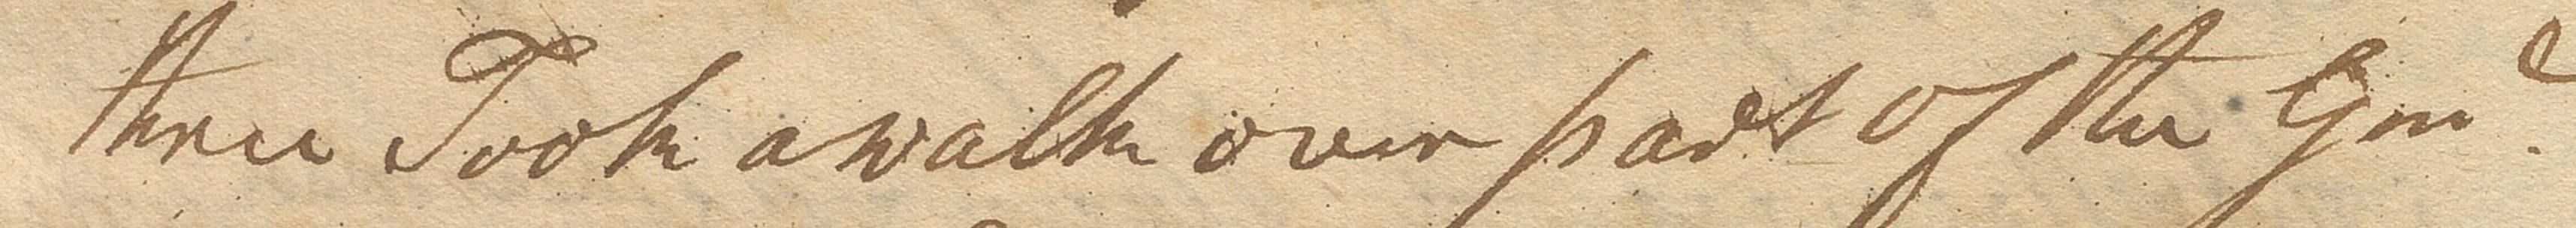three Took a walk over part of the Gen^l.
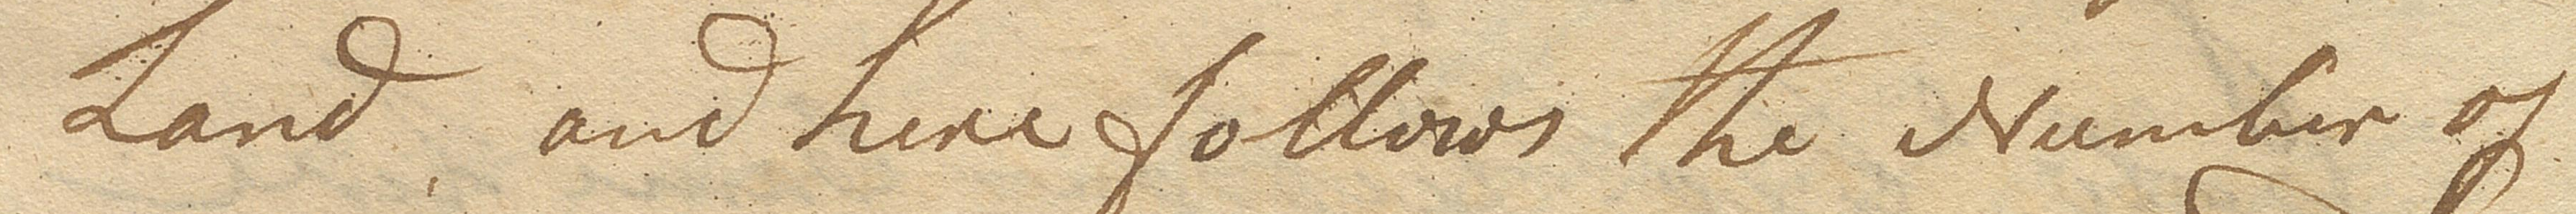Land and here follows the Number of
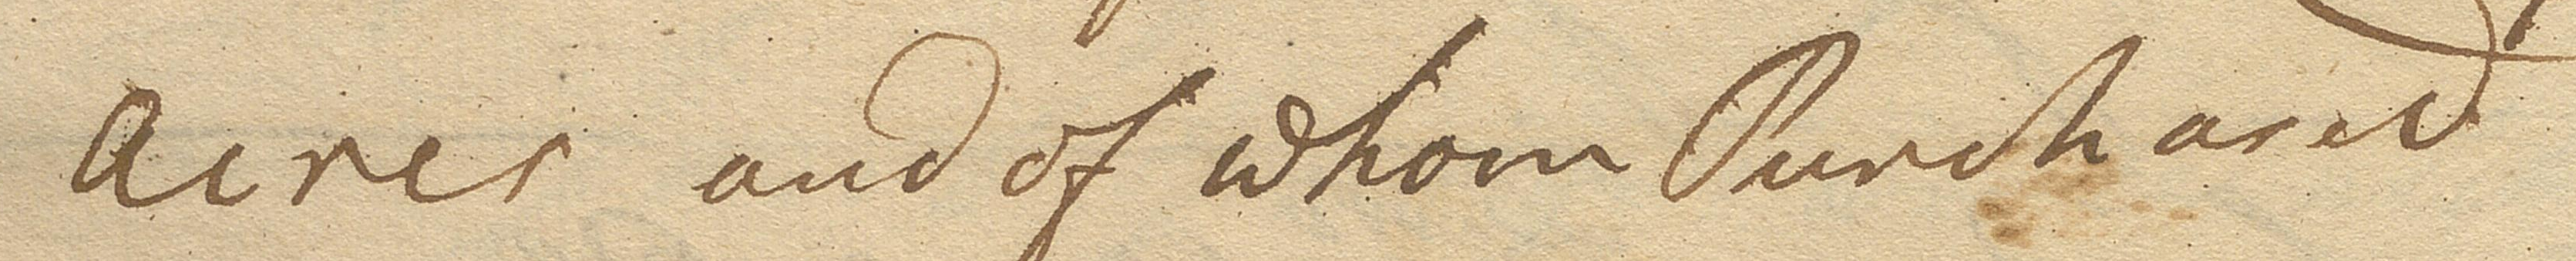acres and of whom Purchased
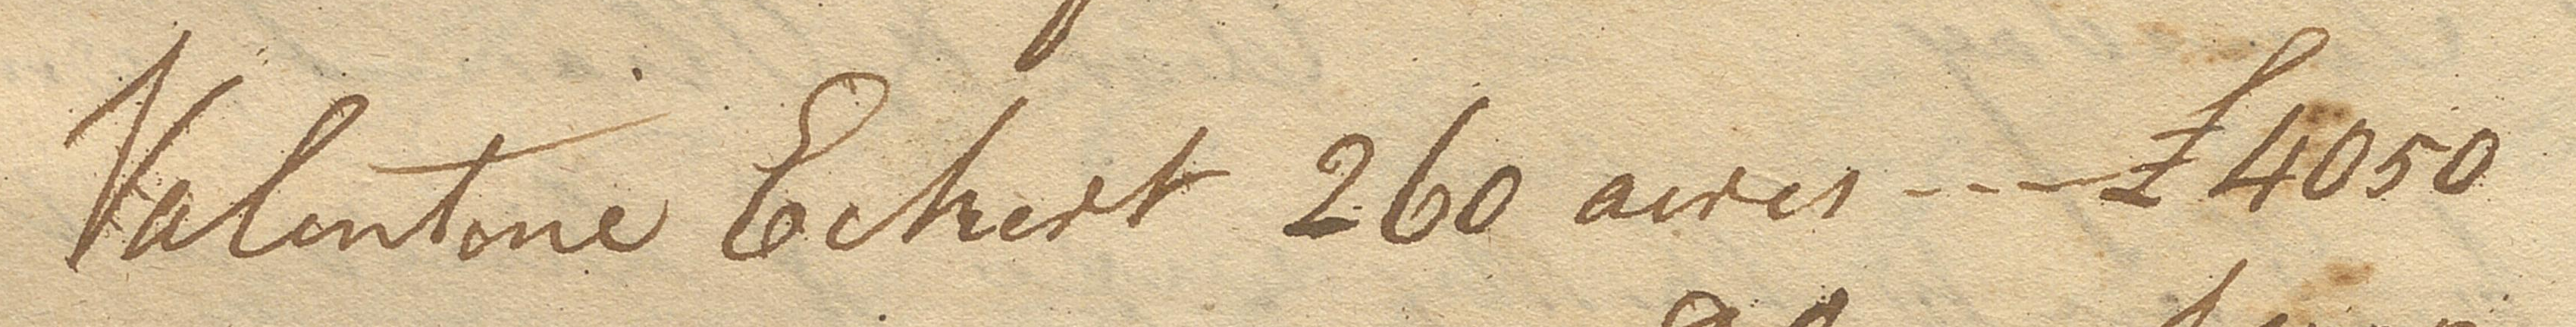Valentine Eckert 260 acres £4050
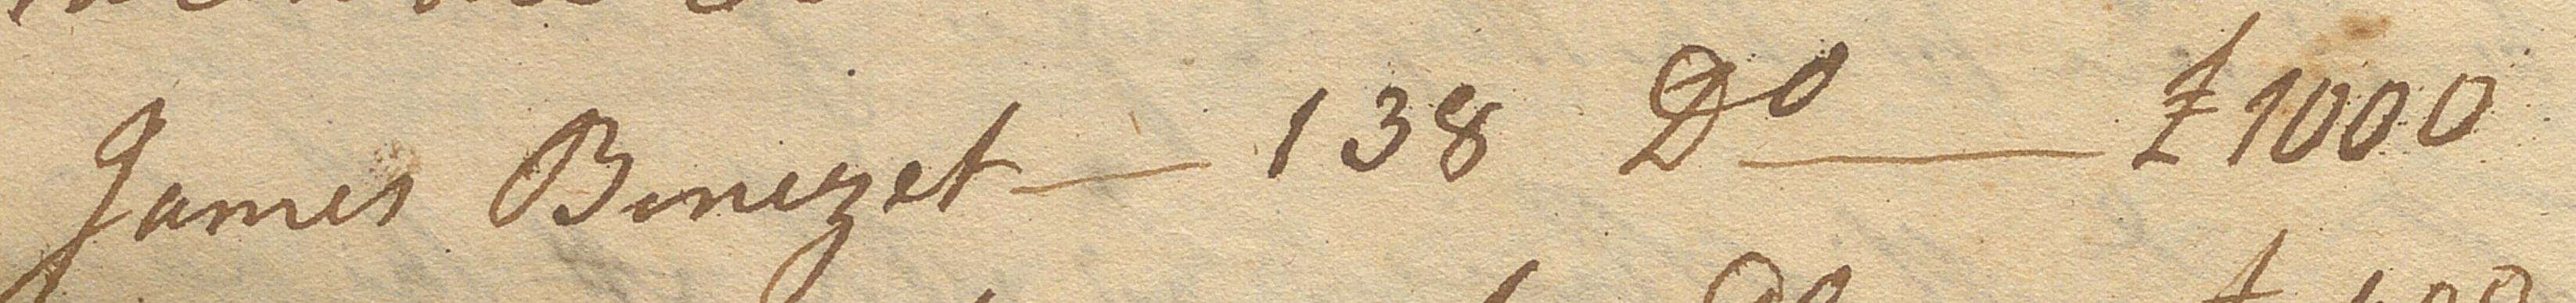James Benezet 138 D^o- £1000
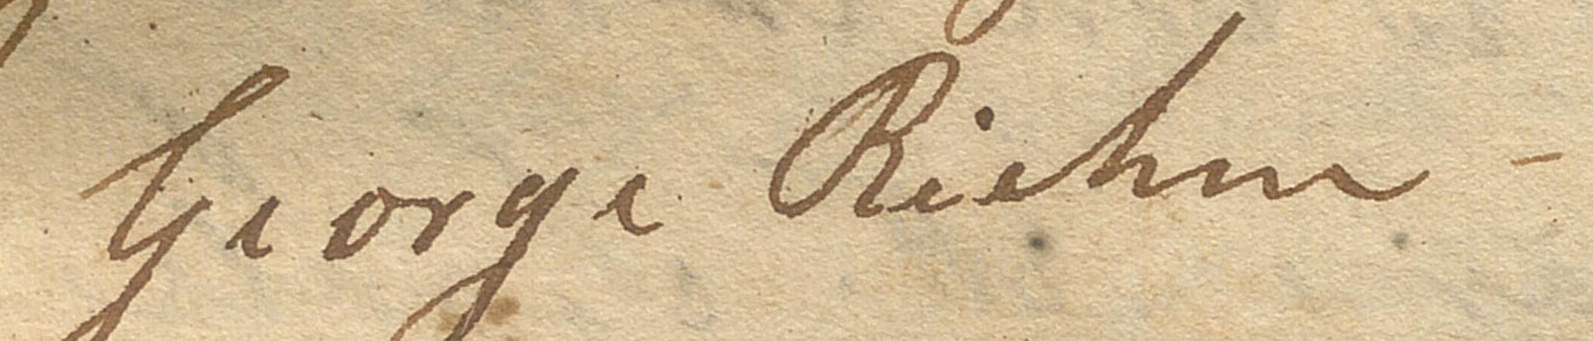George Richer
